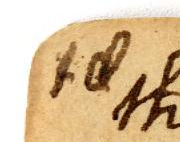18
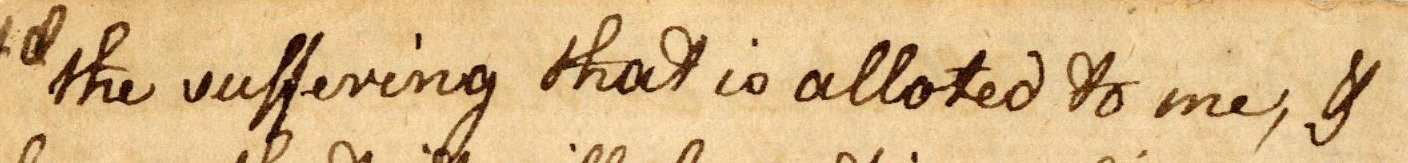the suffering that is alloted to me, &
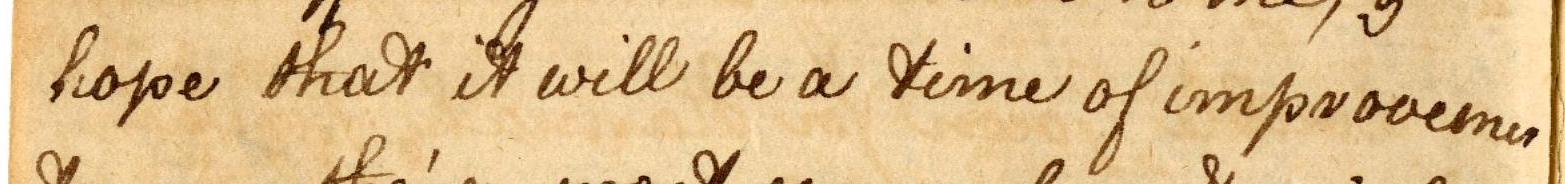hope that it will be a time of improvemen
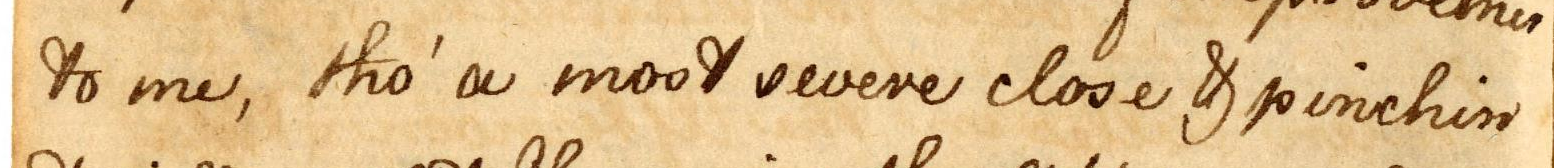to me, tho' a most severe close & pinchin
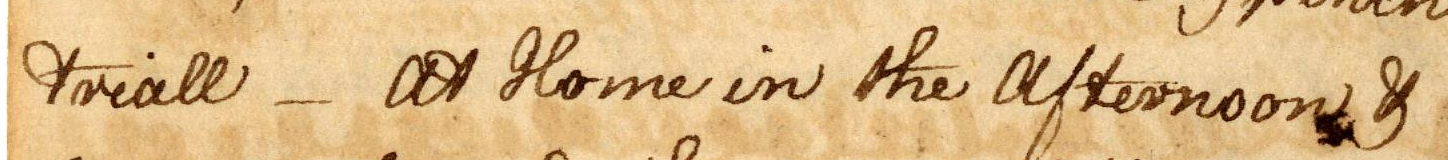triall- At Home in the Afternoon &
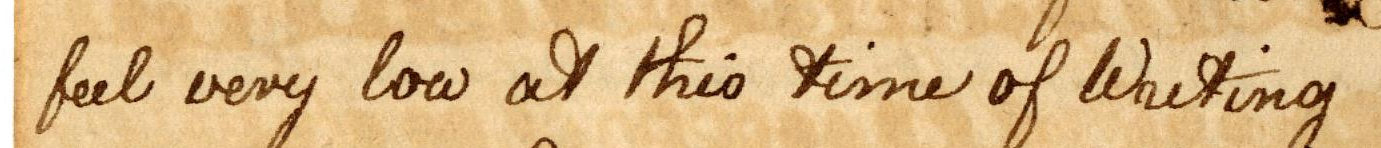feel very low at this time of Writing
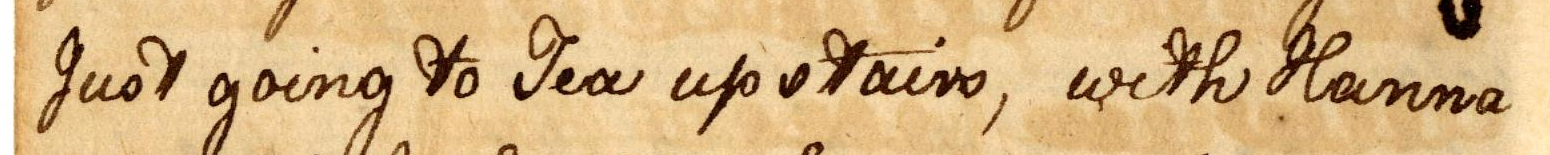Just going to Tea up stairs, with Hanna
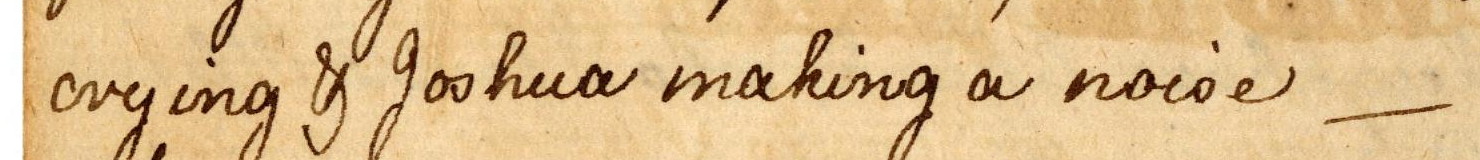crying & Joshua making a noise-
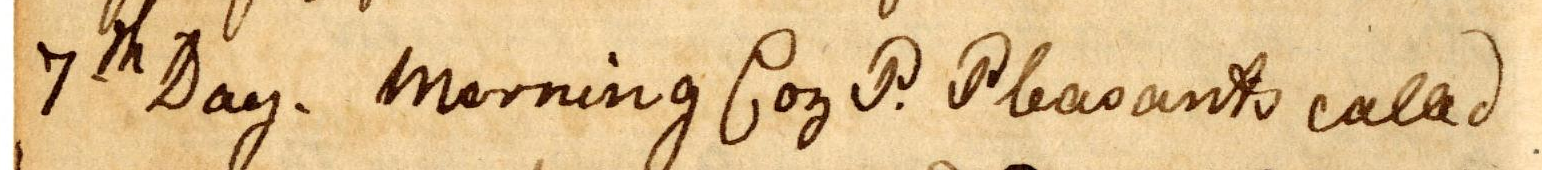7^th Day- Morning Coz P. Pleasants called
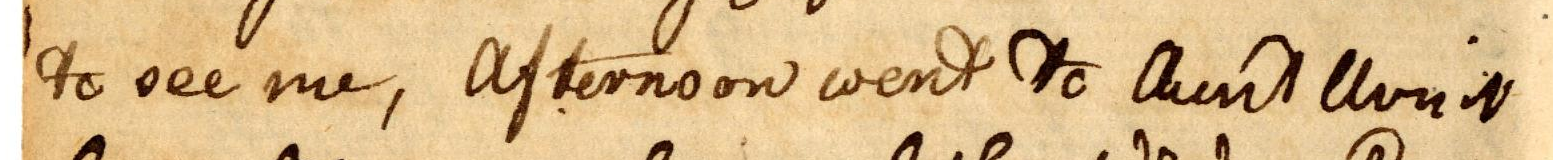to see me, Afternoon went to Aunt Arnit
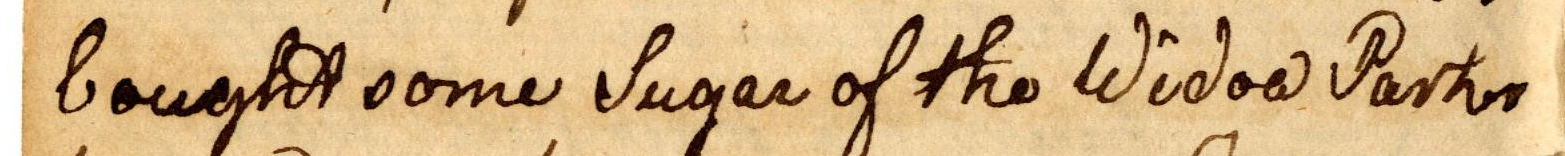bought some Sugar of the Widow Parker
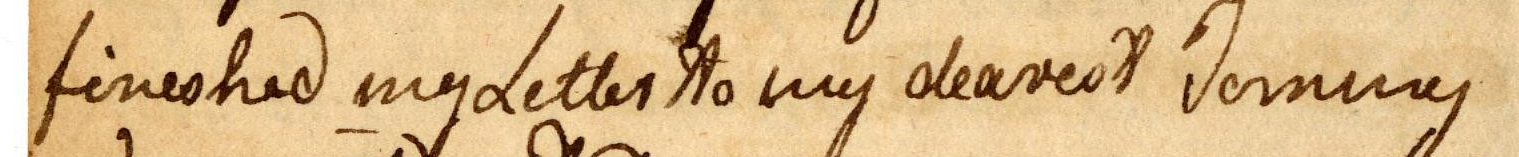fineshed my Letter to my dearest Tommy
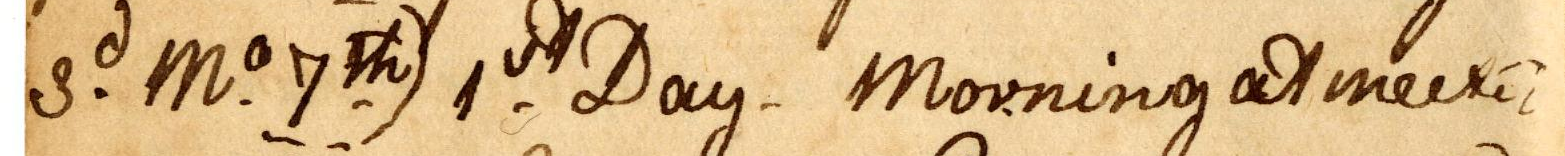3^d M^o. 7^th) 1^st Day- Morning at meeten
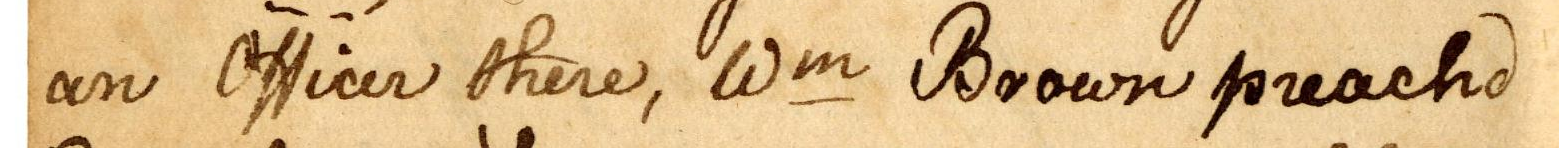an Officer there, W^m Brown preachd
